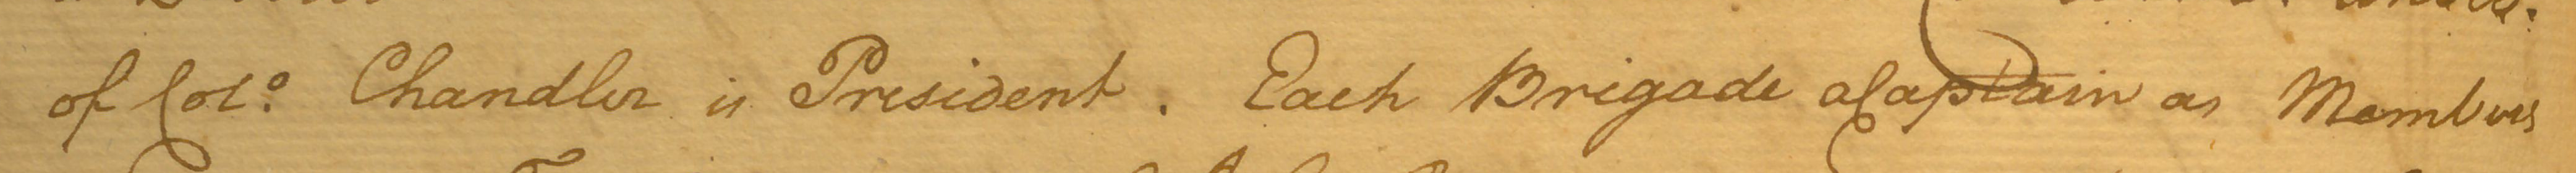of Col^o. Chandler is President. Each Brigade a Captain as Members
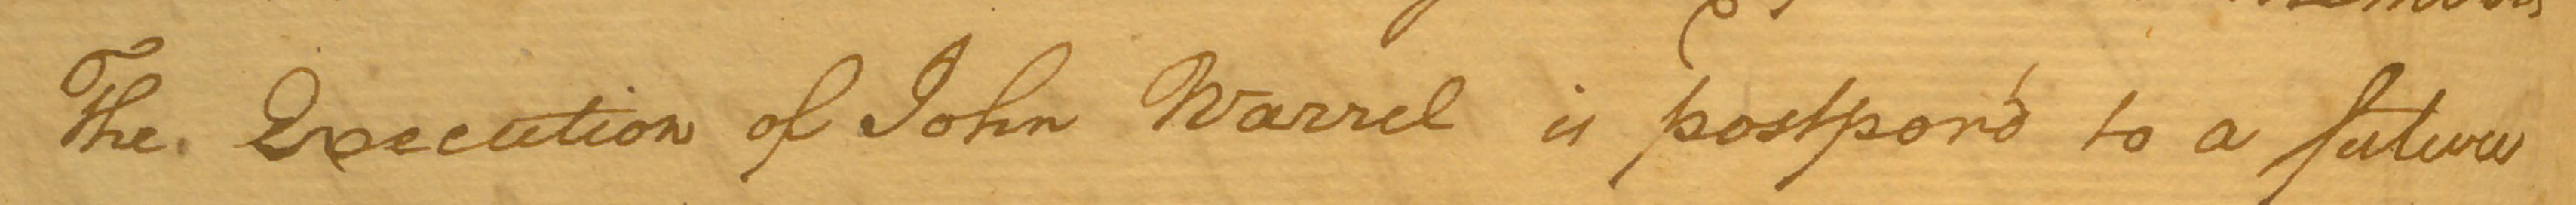The Execution of John Warrel is postpon'd to a future
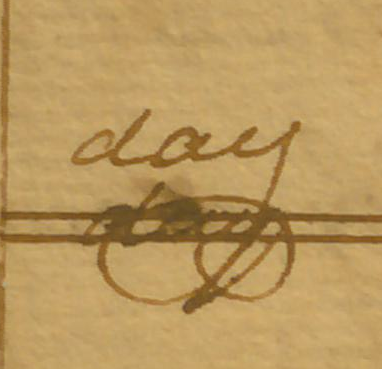day
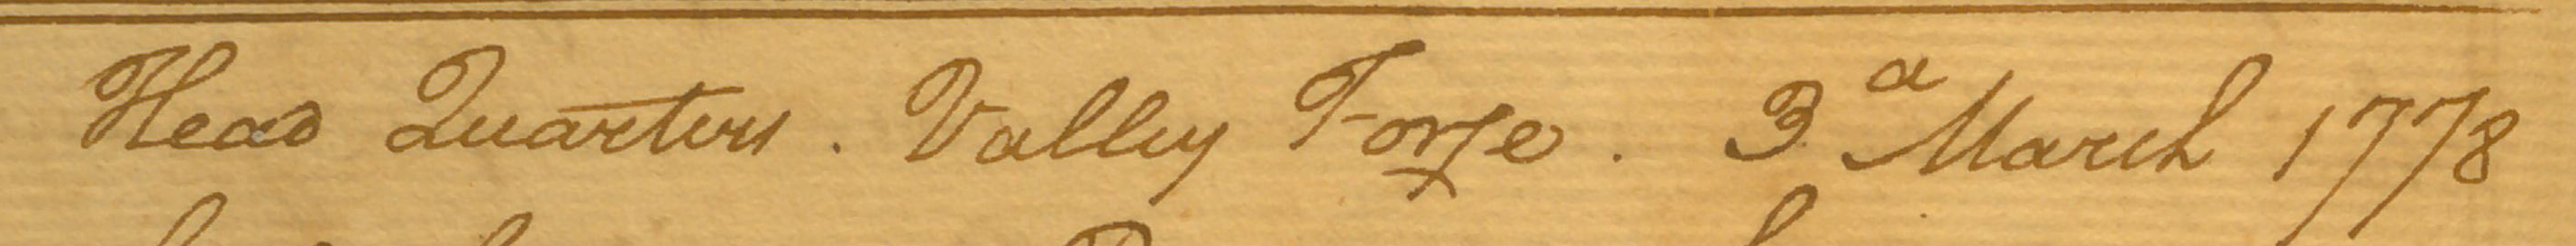Head Quarters. Valley Forge. 3^d March 1778
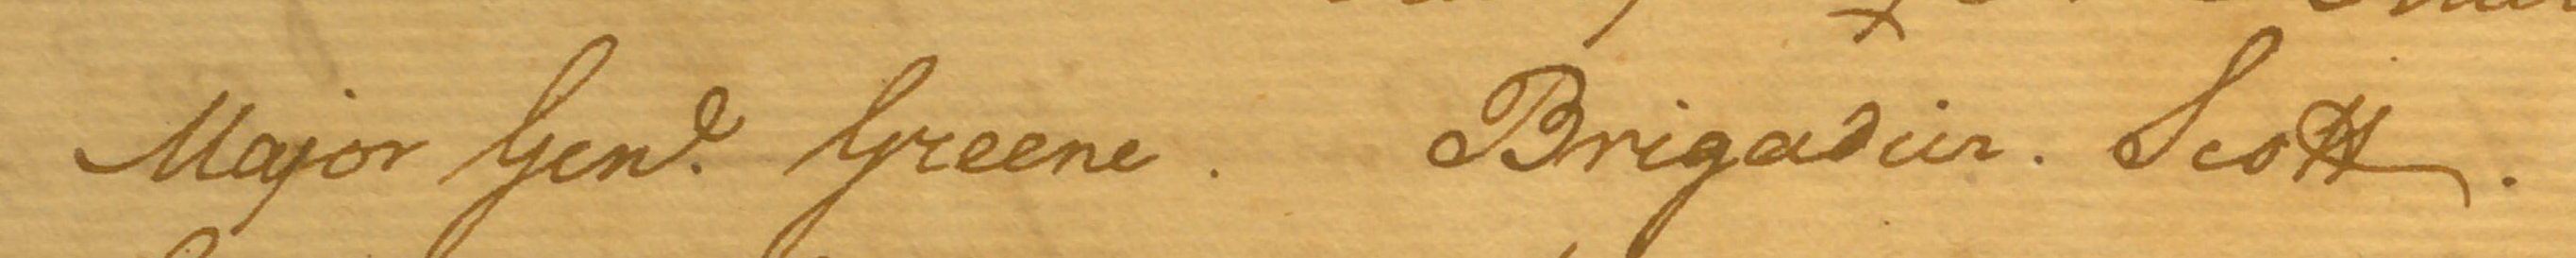Major Gen^l. Greene. Brigadier Scott.
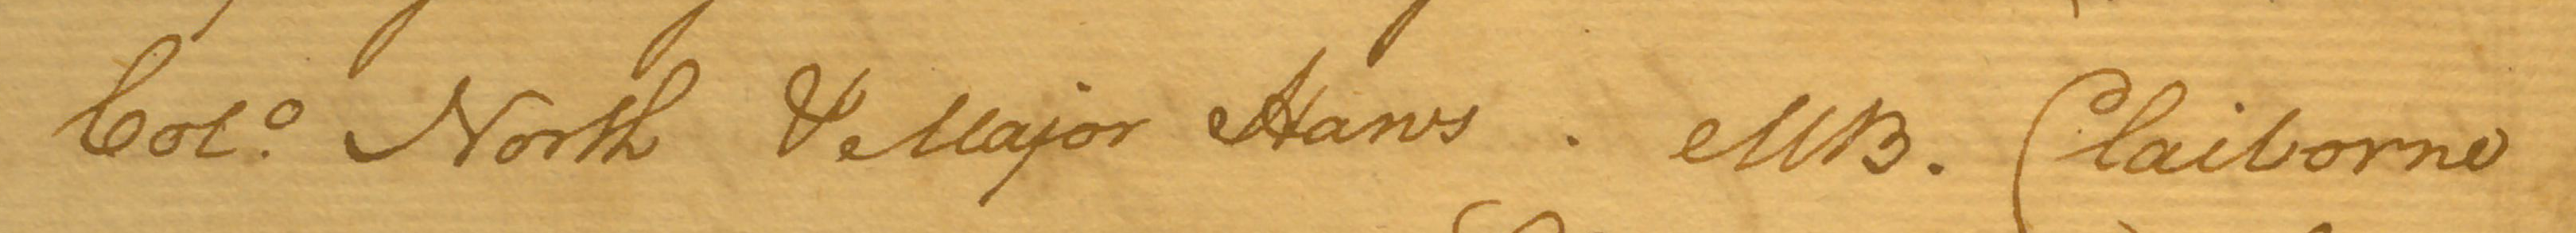Col^o. North & Major Haws. MB. Claiborne
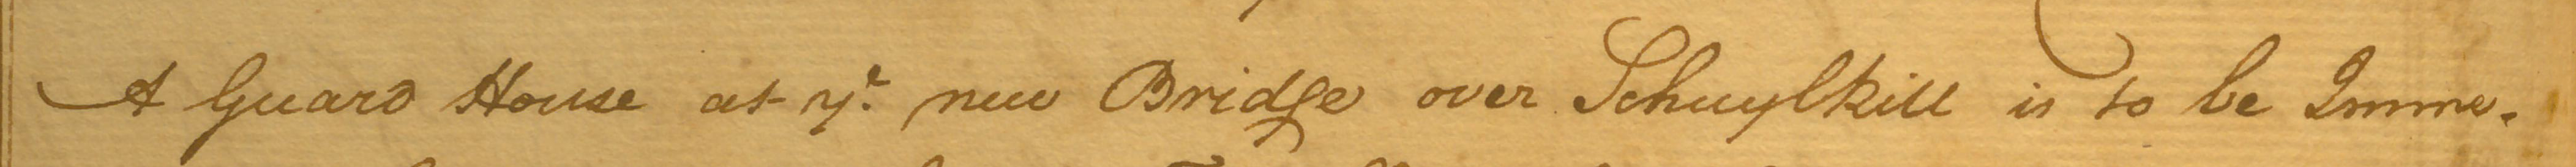A Guard House at y^e. new Bridge over Schuylkill is to be Imme-
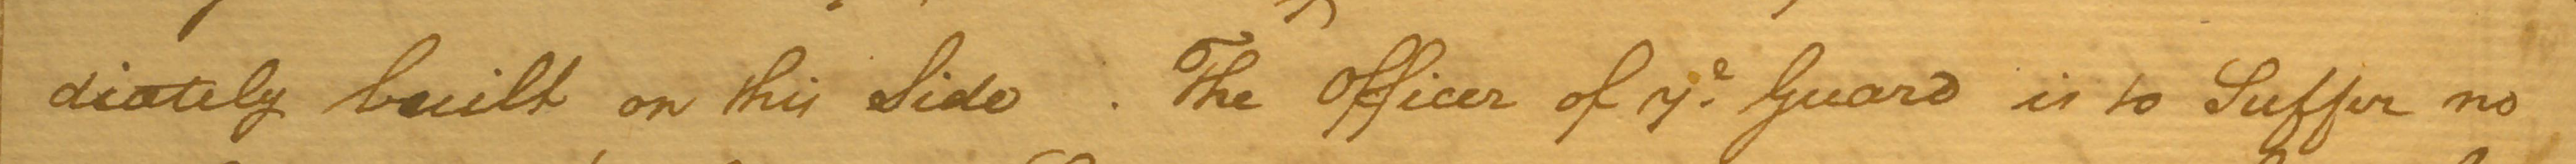diately built on this Side. The officer of y^e. Guard is to suffer no
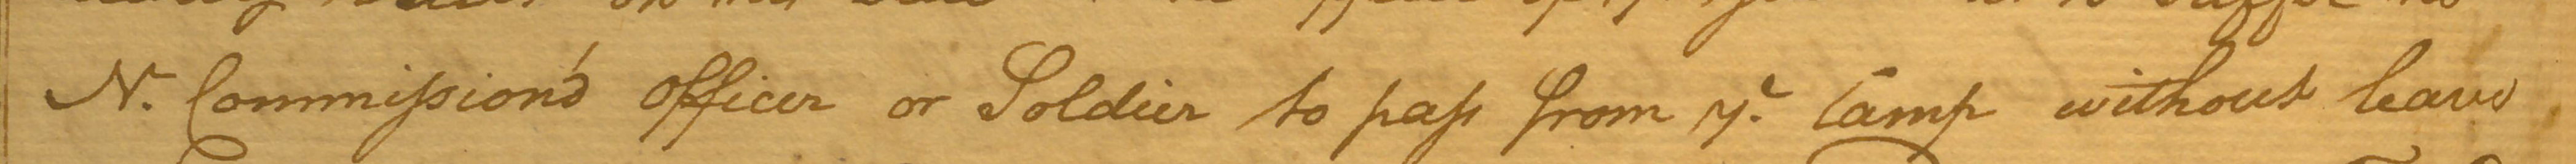N. Commission'd officer or Soldier to pass from y^e. Camp without leave
